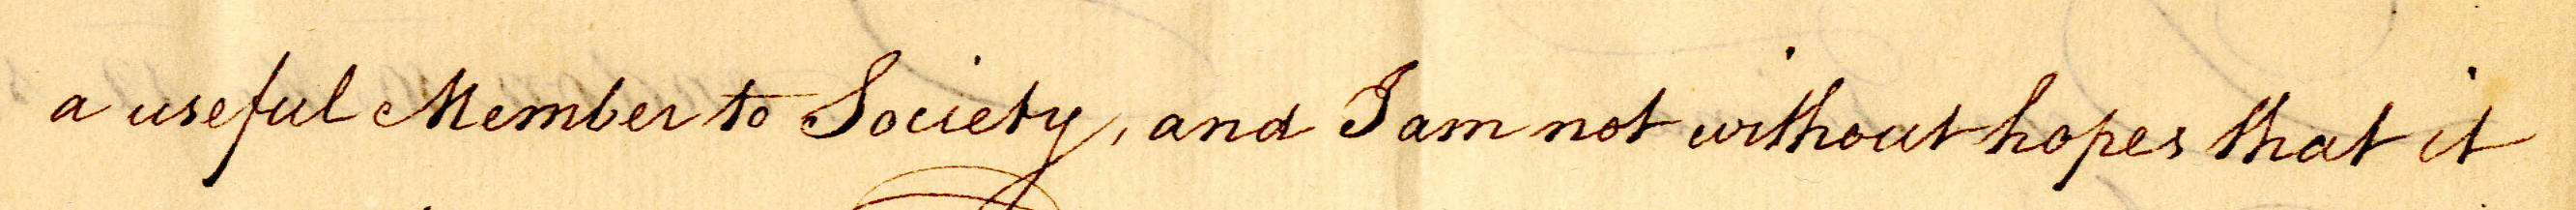a useful Member to Society, and I am not without hopes that it
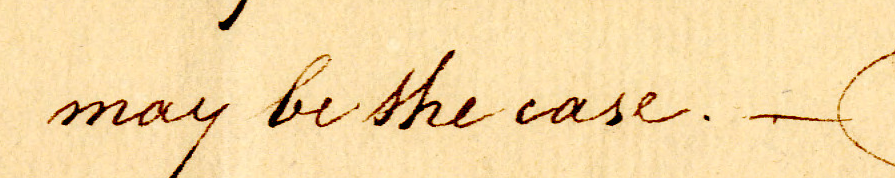may be the case.-
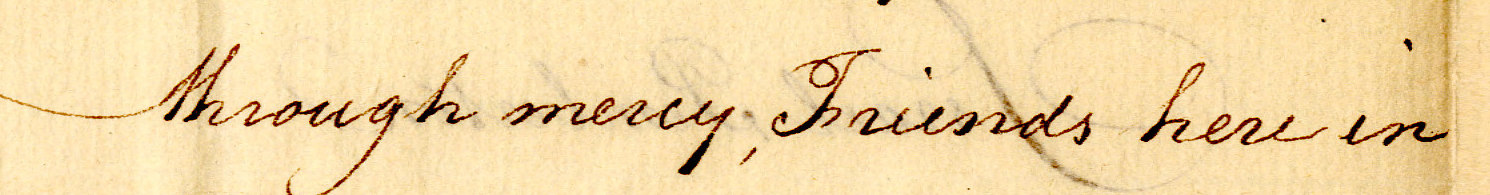through mercy, Friends here in
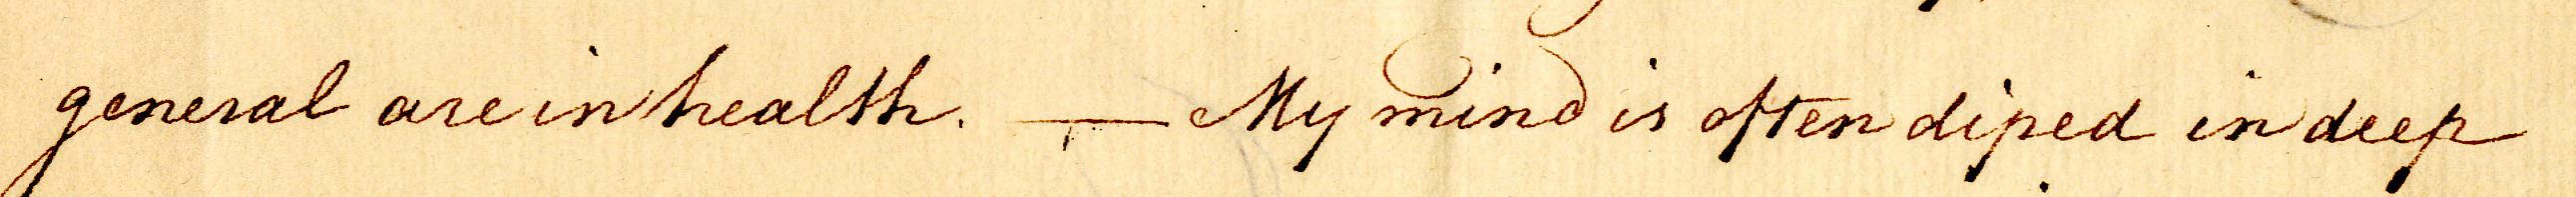general are in health.- My mind is often diped in deep
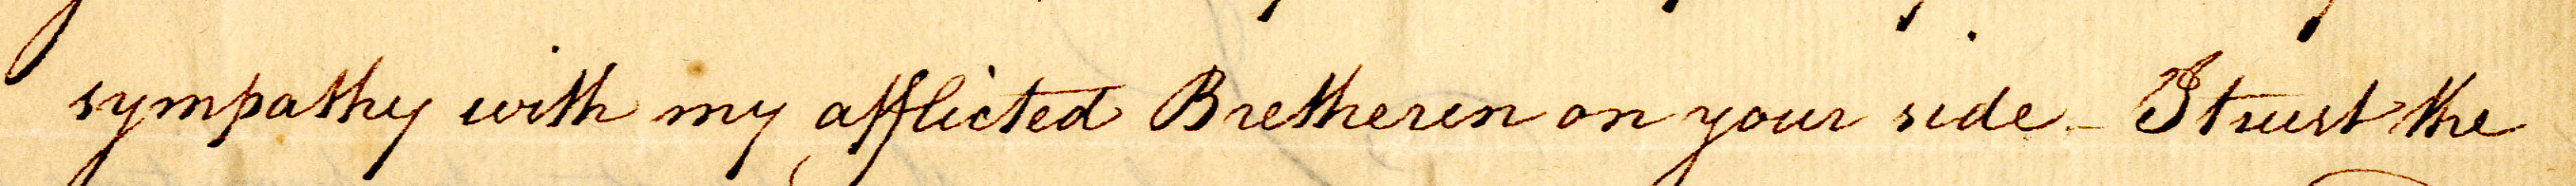sympathy with my afflicted Brethren on your side. I trust the
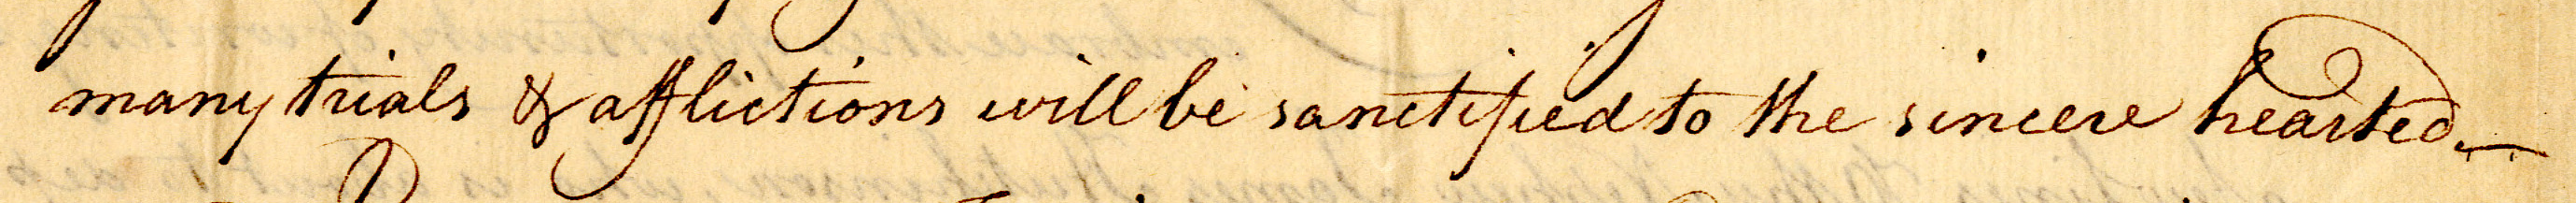many trials & afflictions will be sanctified to the sincere hearted.-
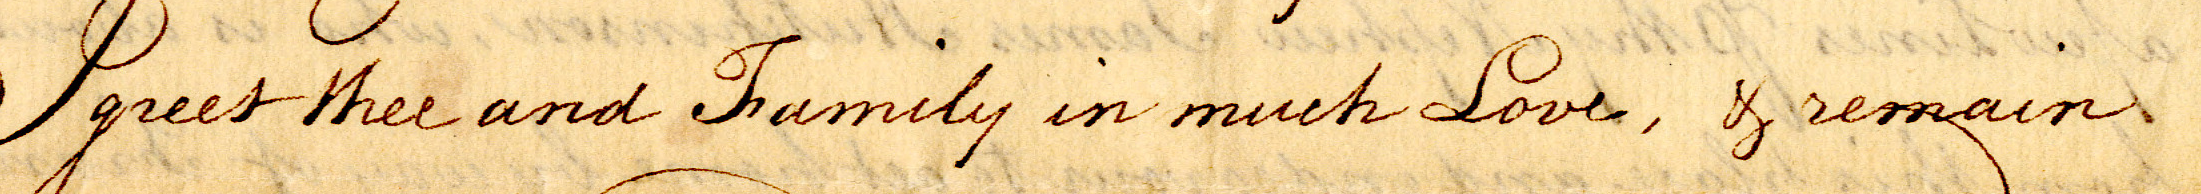I greet thee and Family in much Love, & remain
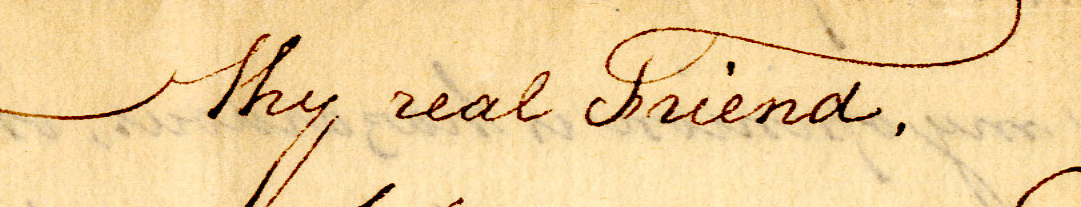thy real Friend,
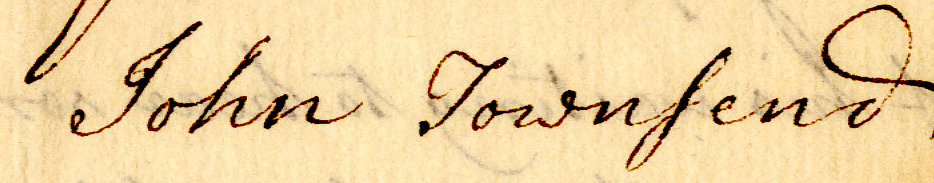John Townsend
